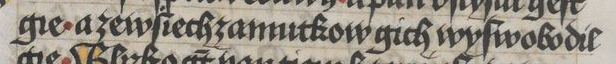gie.a zewẛiech zamutkow gich wyſwobodíl
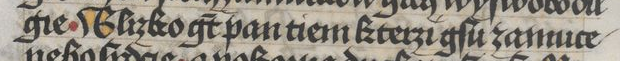gie.Blizko ḡt pan tiem kterzí gſu zamuce¬
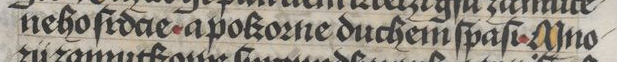neho ſrdcie.a pokorne duchem ſpaſi.Mno¬
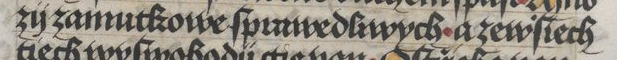zij zamutkowe ſprawedliwych.a zewẛiech
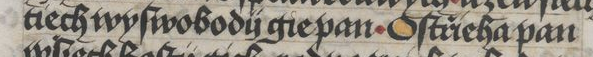tiech wyſwobodij gie pan.Oſtṙíeha pan
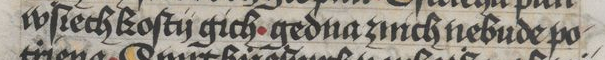wẛiech koſtij gich.gedna znich nebude po¬
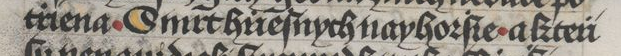tṙíena.Smrt hṙieẛnych nayhorẛie.a kteṙí
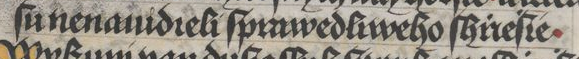ſu nenauidielí ſprawedliweho ſhṙieẛíe.
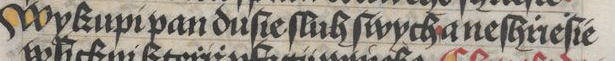Wykupí pan duſie ſluh ſwych.a neſhṙieẛíe
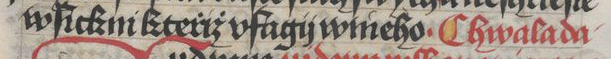wſickni kteṙíż vſagij wnieho.Chwalala da¬
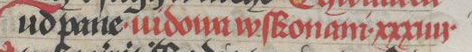ud pane.uidowa wſkonaní.xxxiiij.
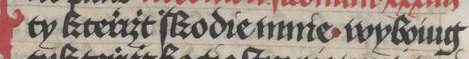ty kteṙiżt ẛkodie mnie.wyboiug
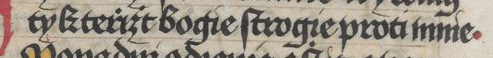ty kteṙiżt bogie ſtrogíe proti mnie.
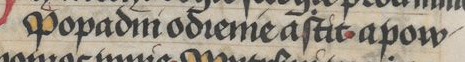Popadni odieníe.aẛtit.a pow¬
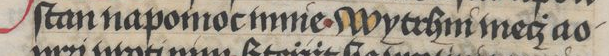ſtan napomoc mnie.Wytrhni mecż ao¬
